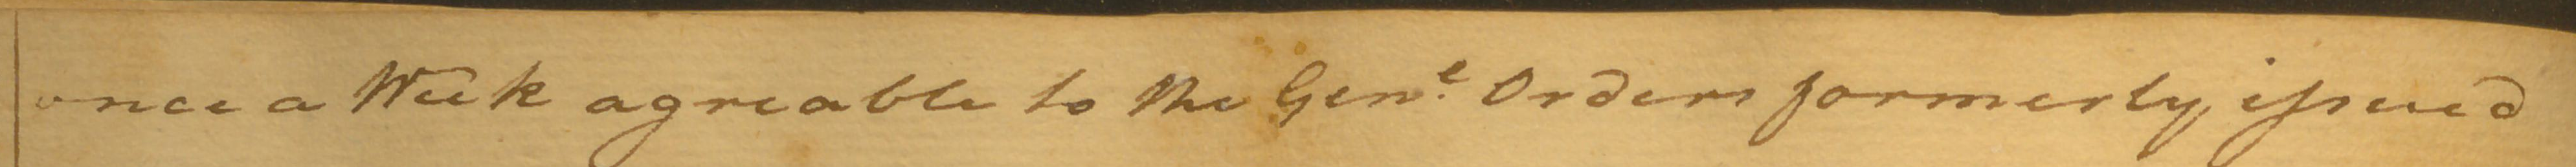once a Week agreable to the Gen^l. Orders formerly issued
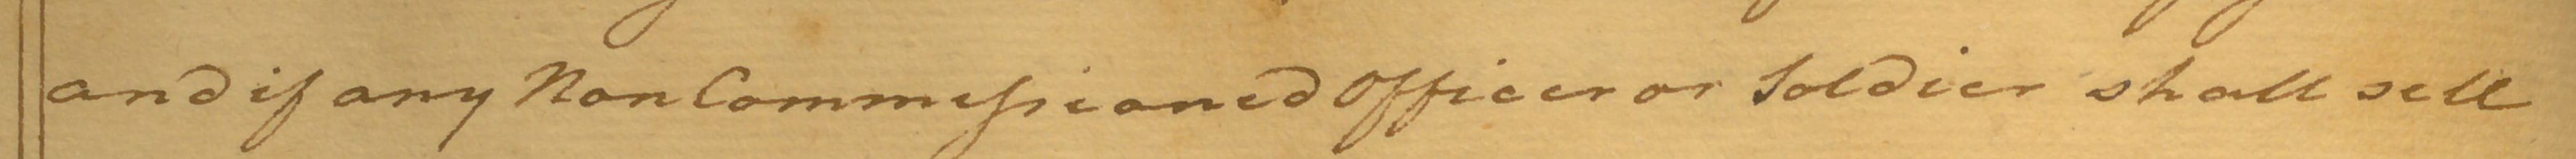and if any Non Commissioned Officers or Solider shall sell
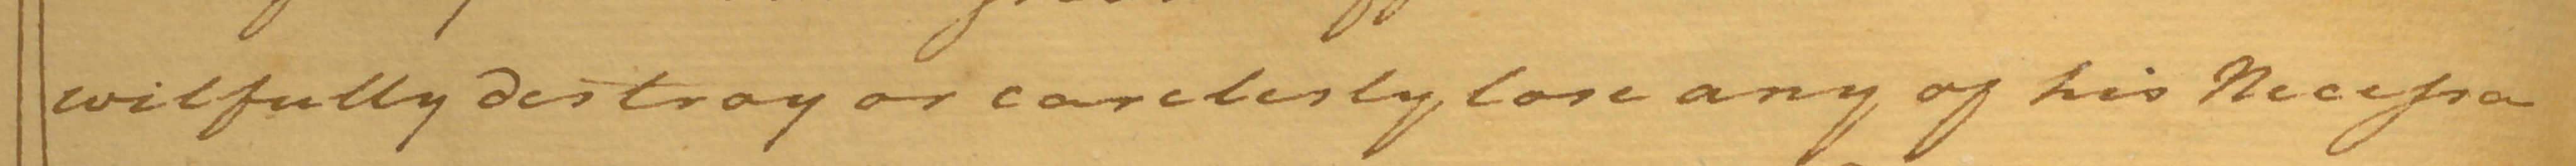willfully destroy or carelessly lose any of his Necessa
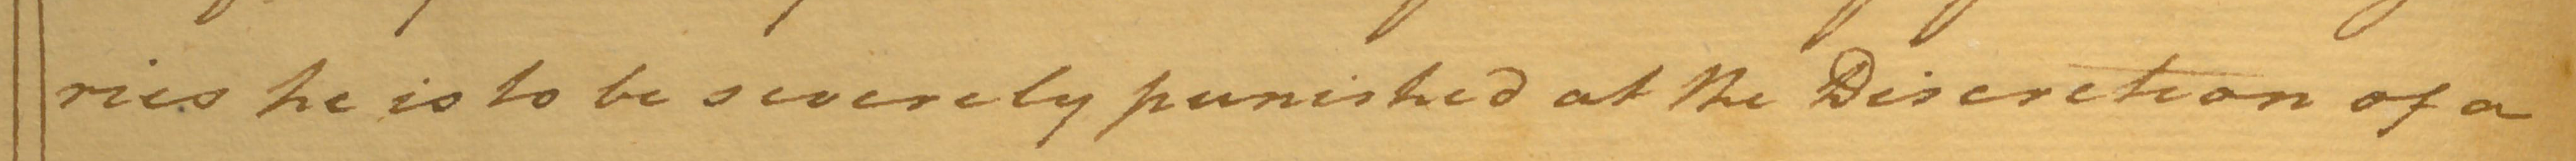ries he is to be severely punished at the Discretion of a
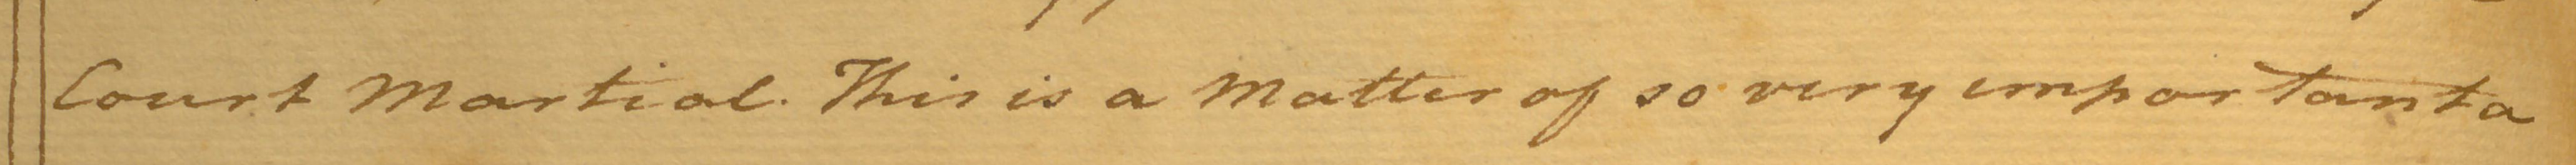Court Martial. This is a Matter of so very important a
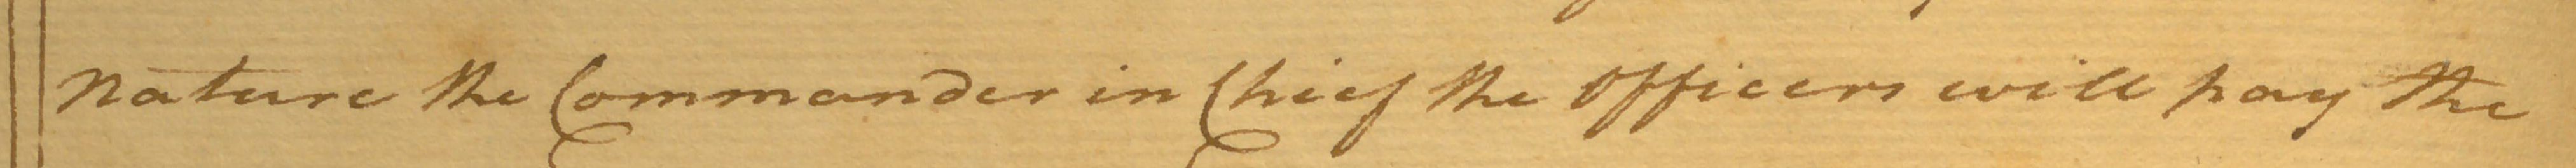nature the Commander in Chief the officers will pay the
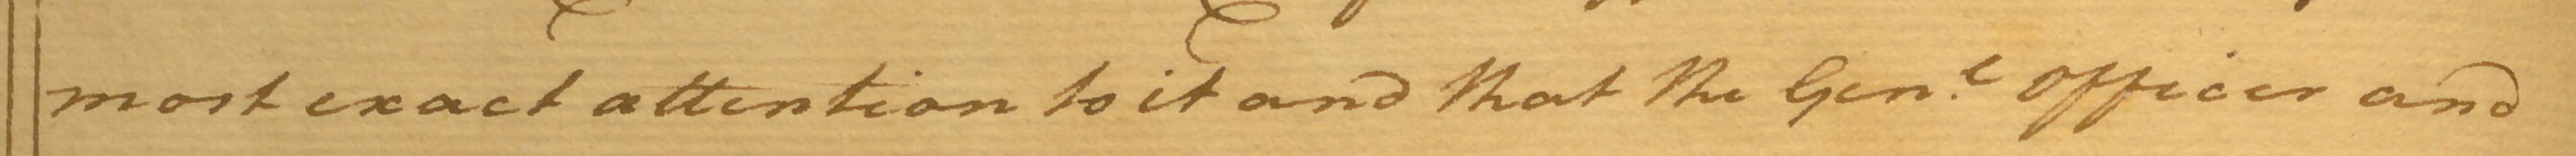most exact attention to it and that the Gen^l. officer and
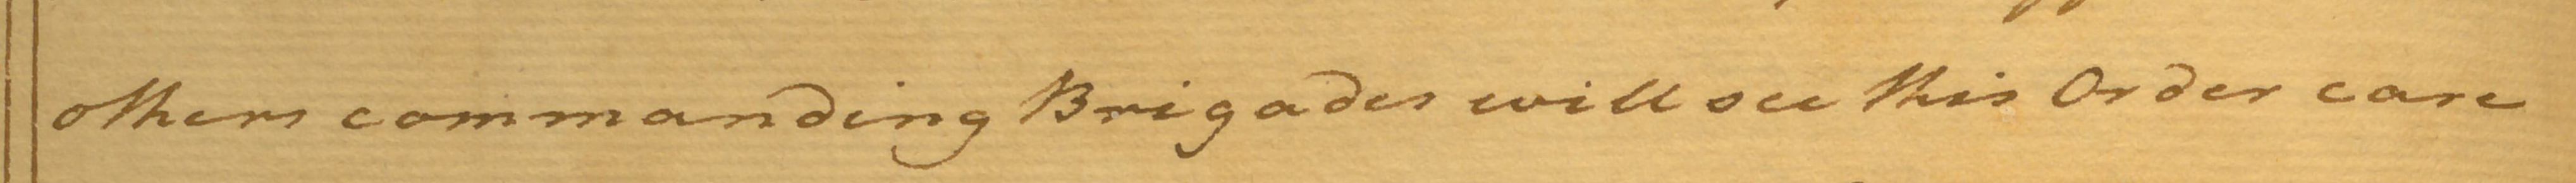others commanding Brigades will see this Order care
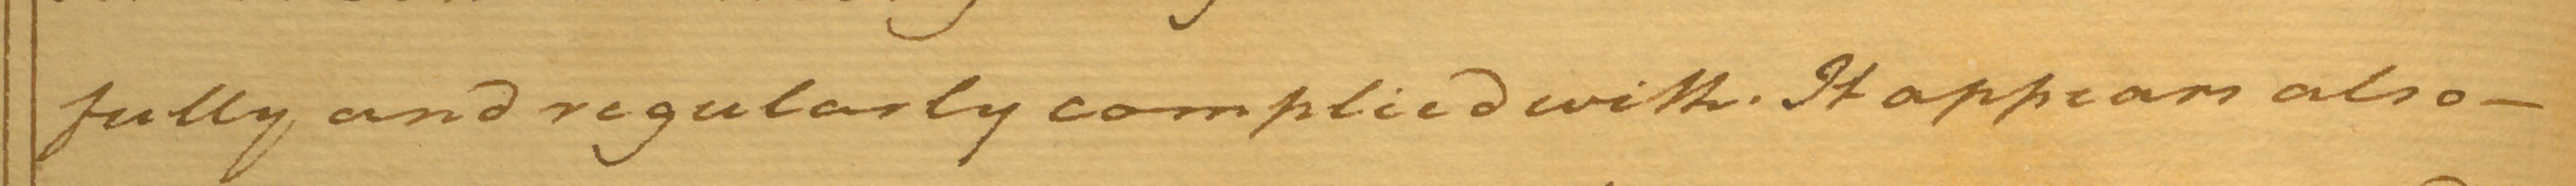fully and regularly complied with. It appears also-
